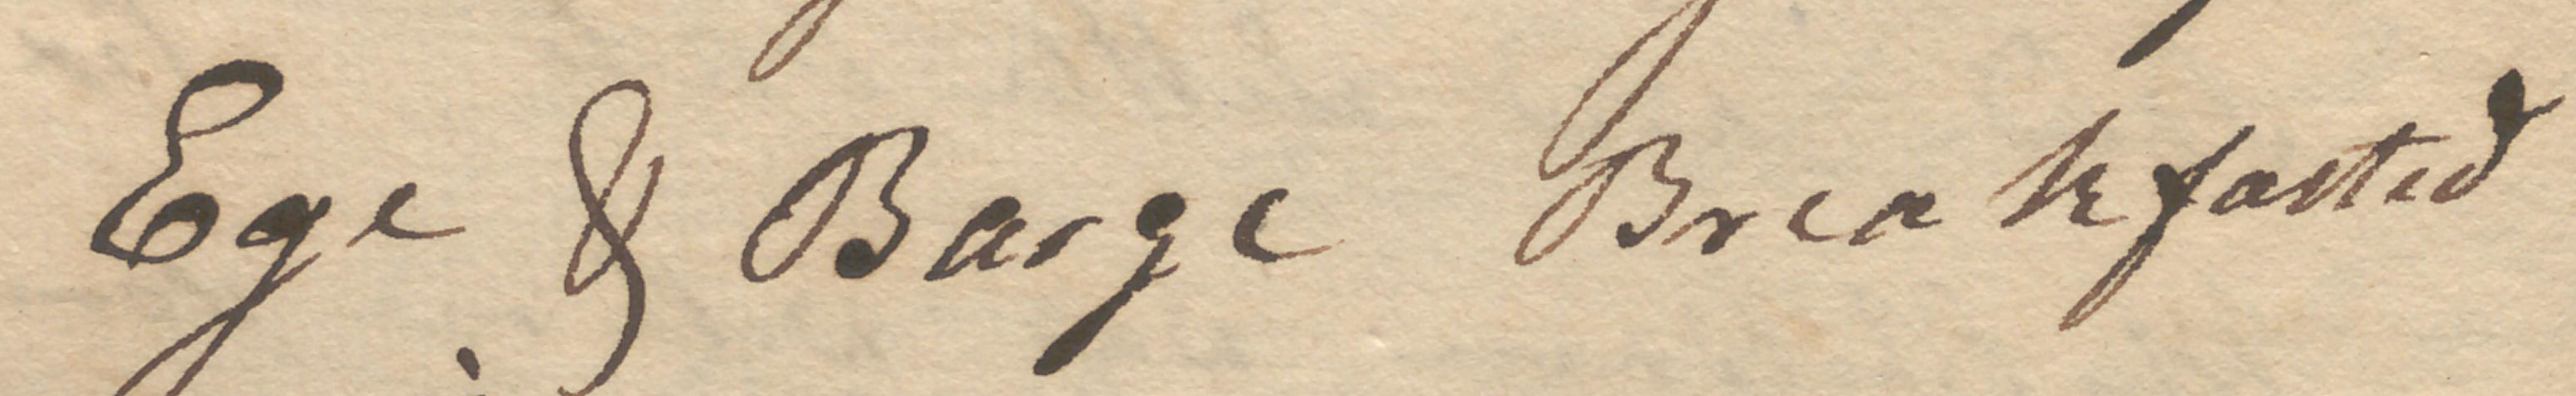Ege & Barge Breakfasted
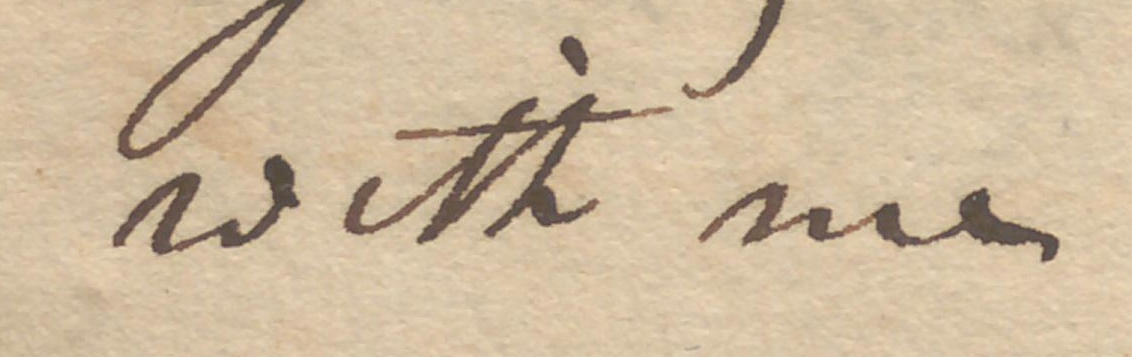with me
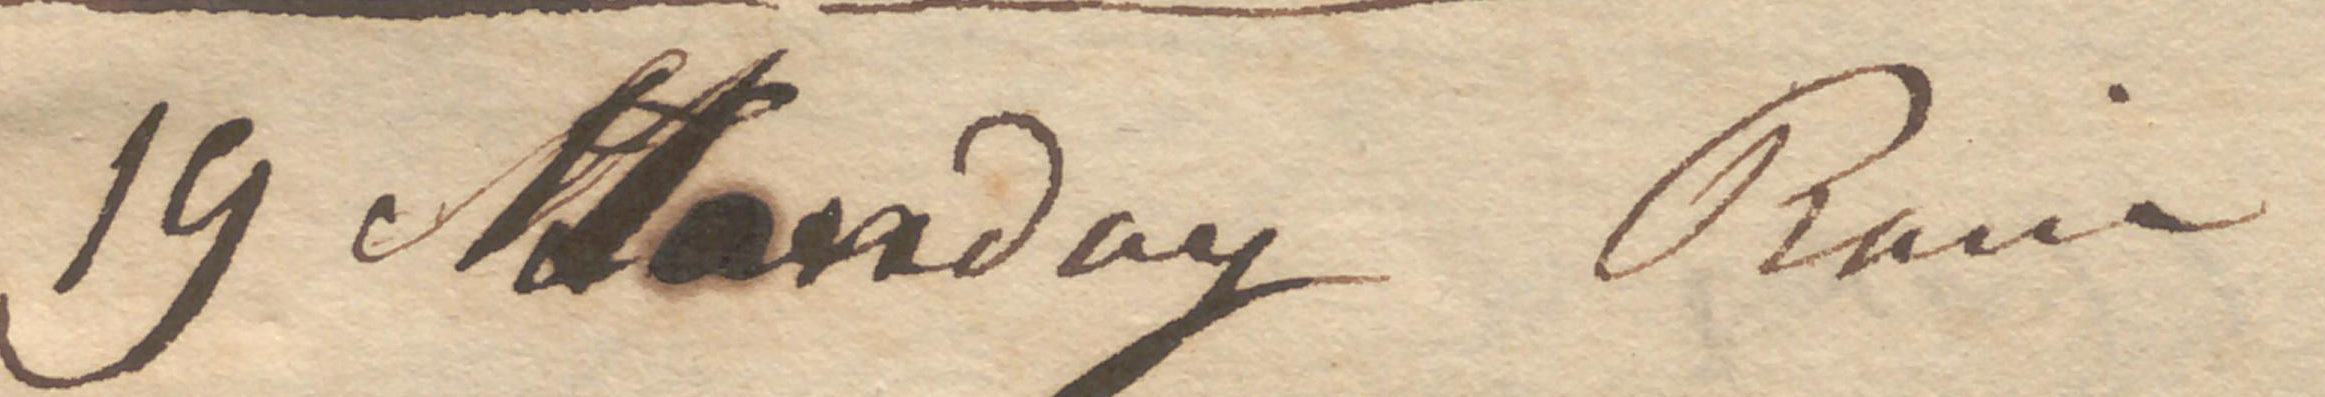19 Monday Rain
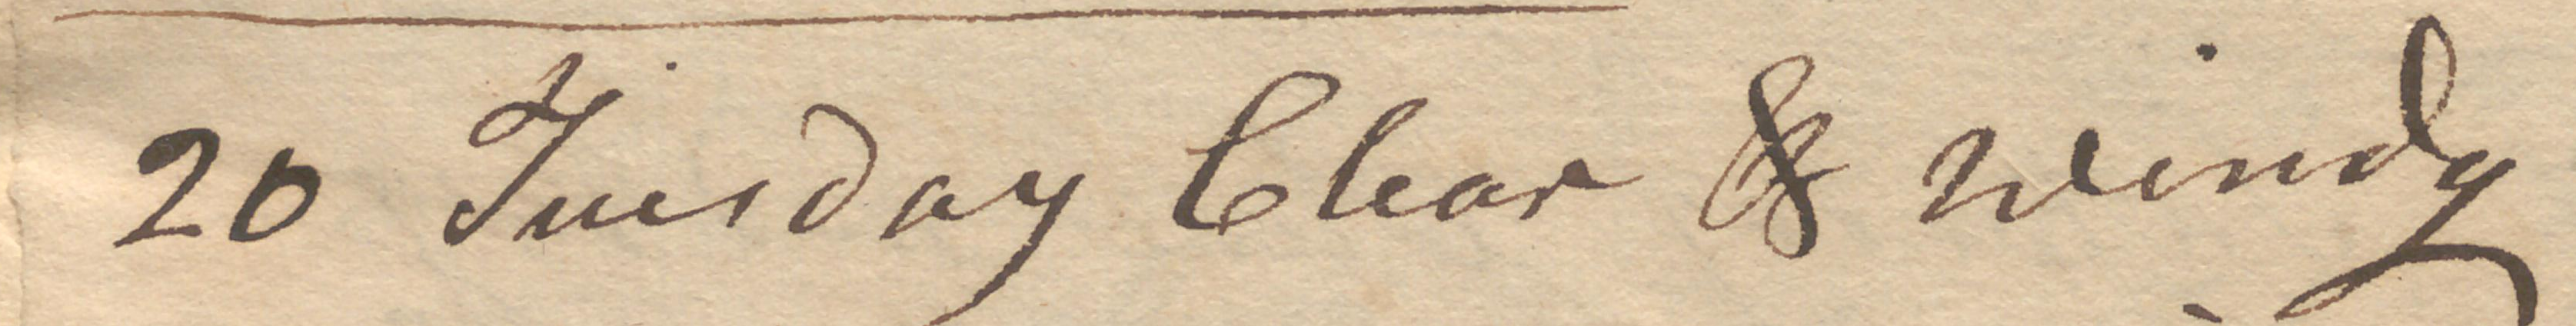20 Tuesday Clear & windy
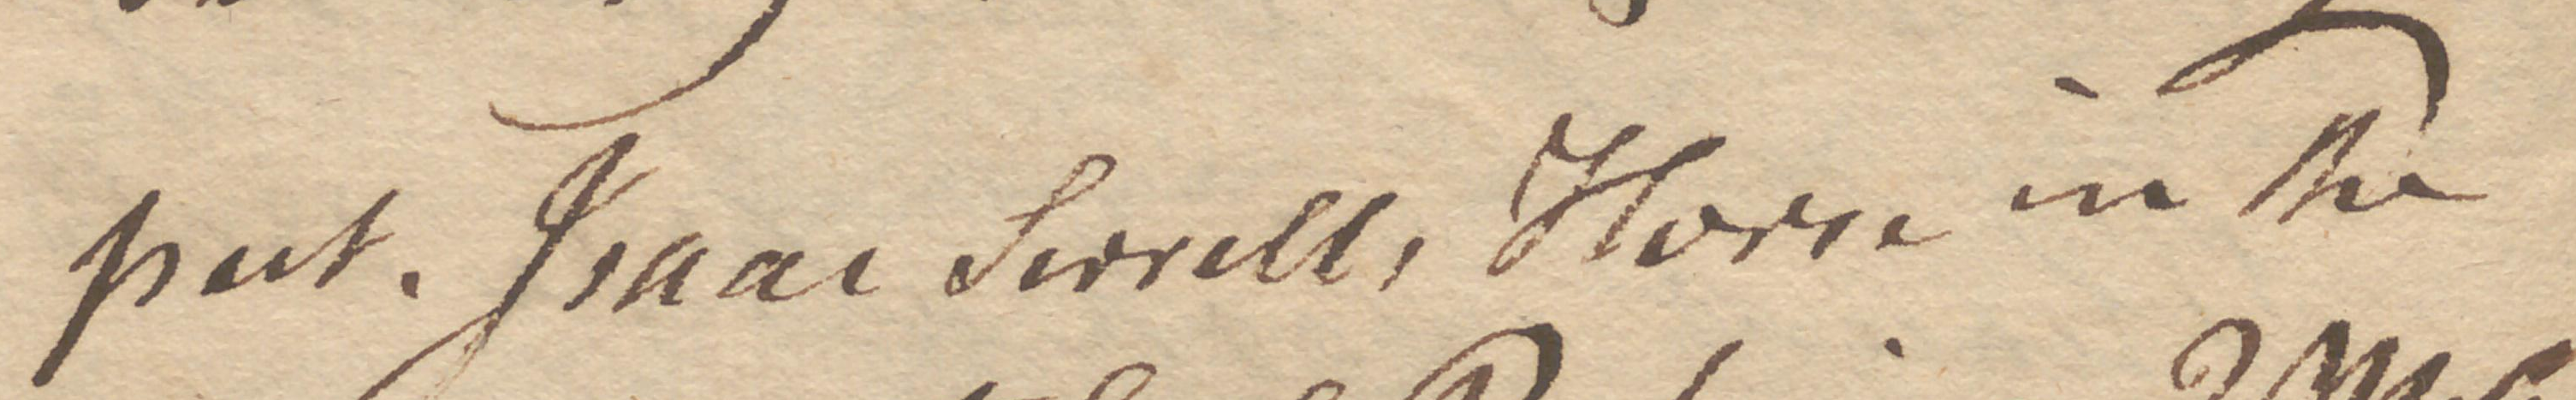put. Isaac Sorrells Horse in the
